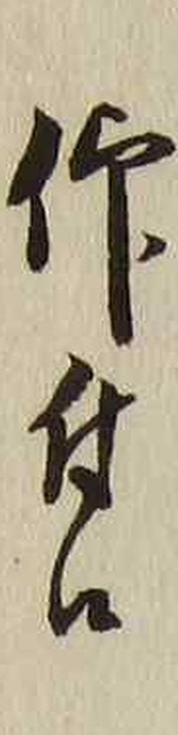仰付候
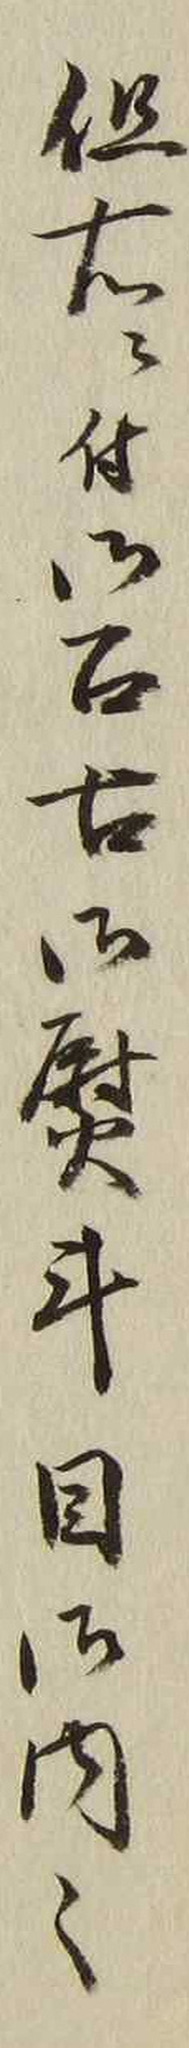但右ニ付御召古御熨斗目御内々
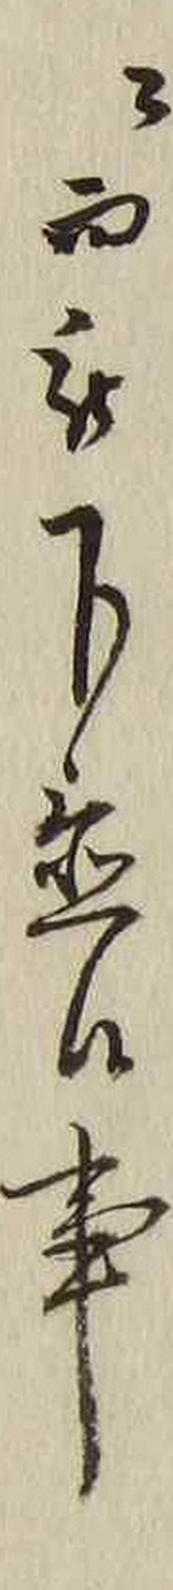ニ而被下置候事

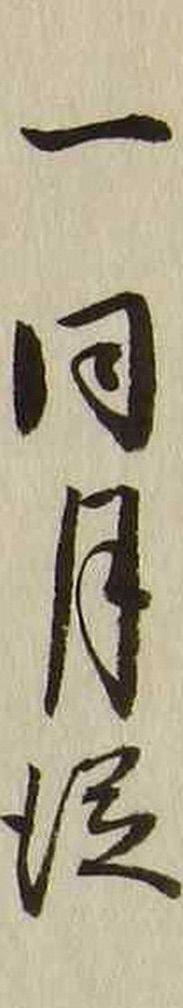一同月従
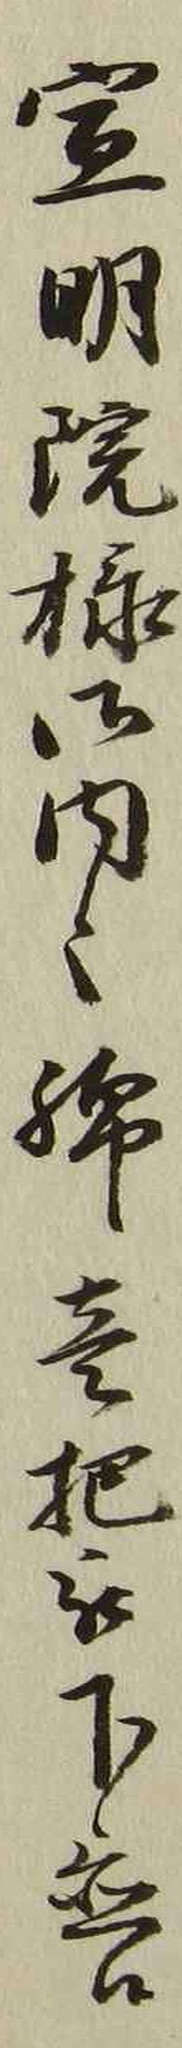宣明院様御内々綿壱把被下置候
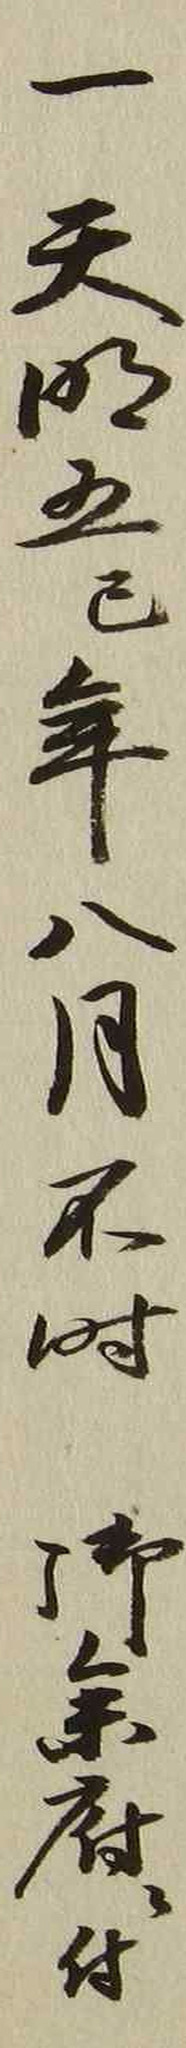一天明五巳年八月不時御参府ニ付
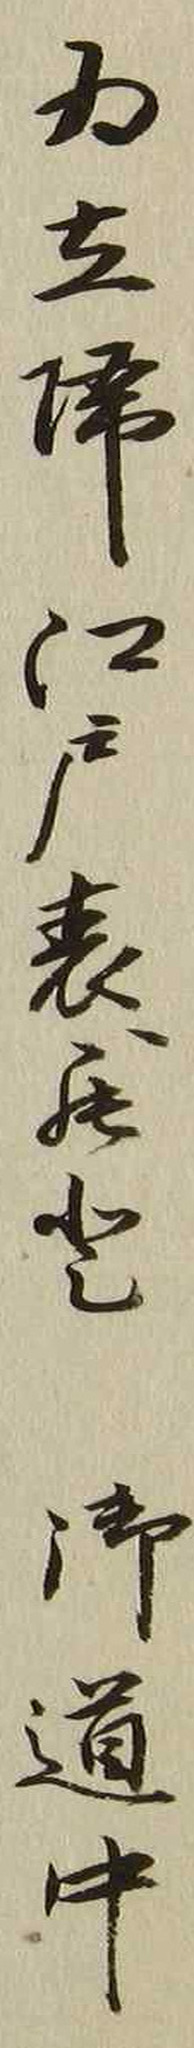為立帰江戸表へ罷登御道中
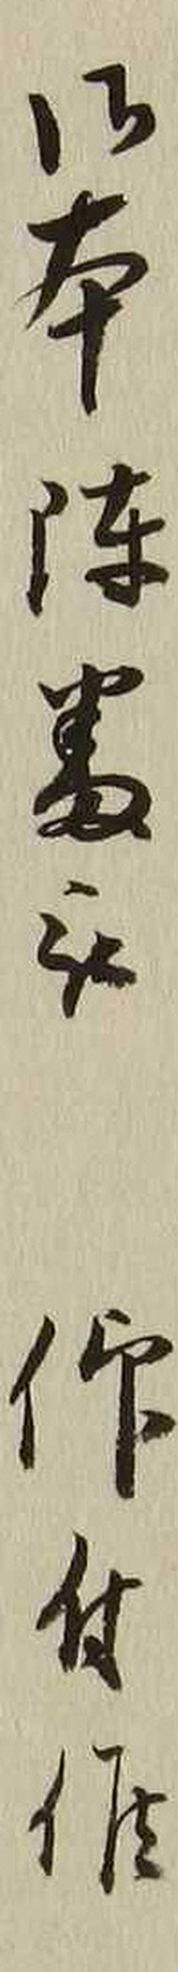御本陣番被仰付候
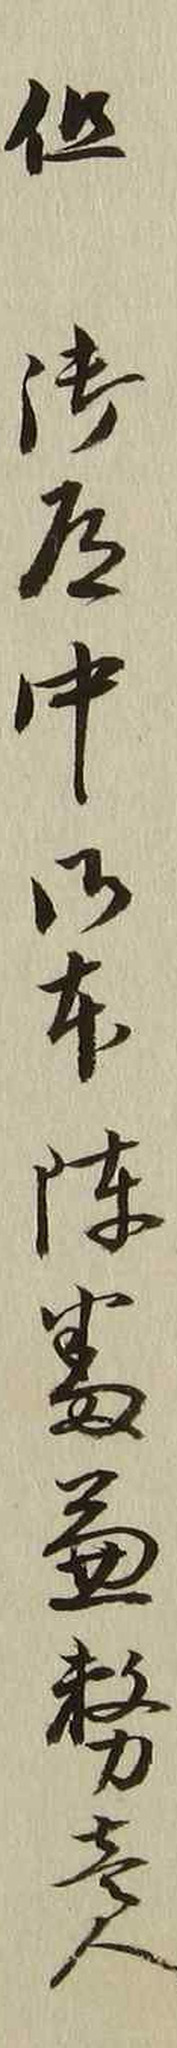但御道中御本陣番兼務壱人
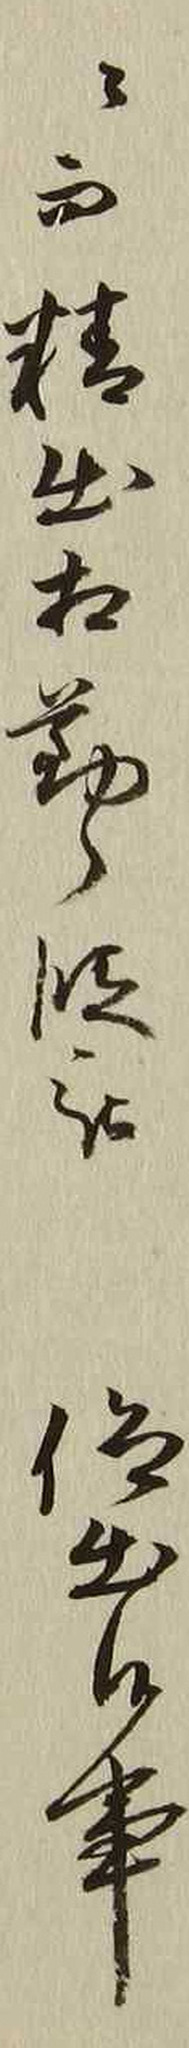ニ而精出相勤候段被仰出候事
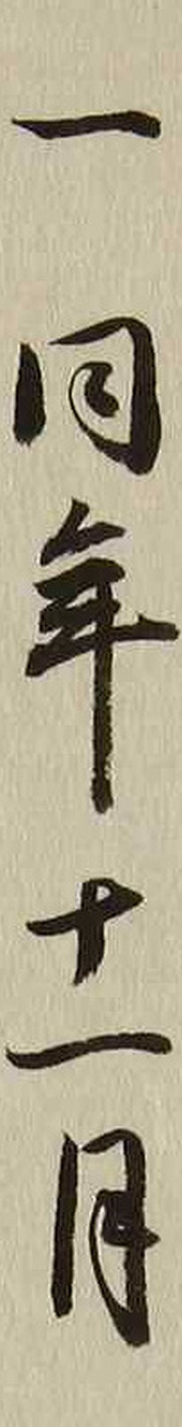一同年十一月
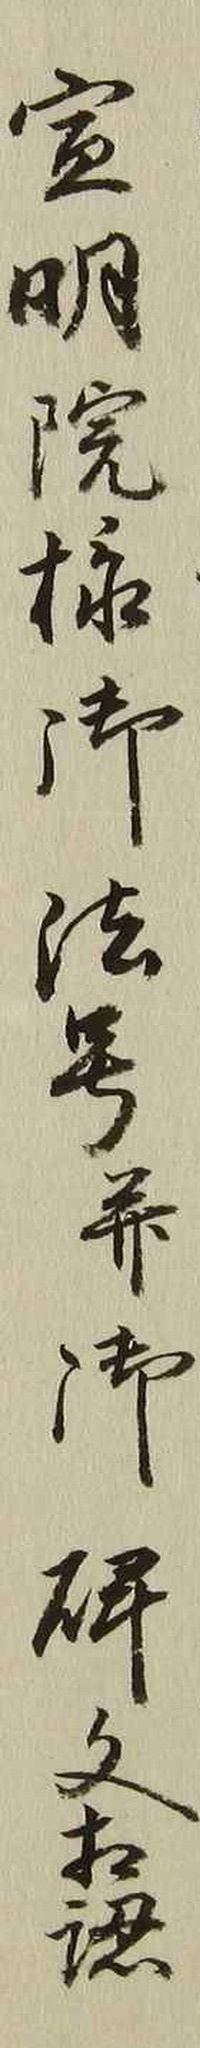宣明院様御法号幷御碑文相認
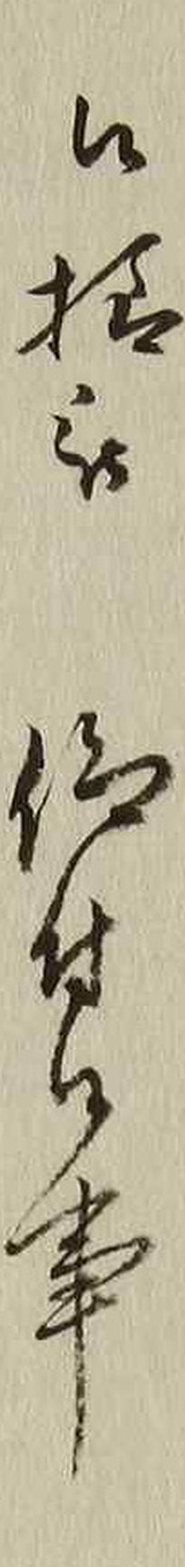候様被仰付候事
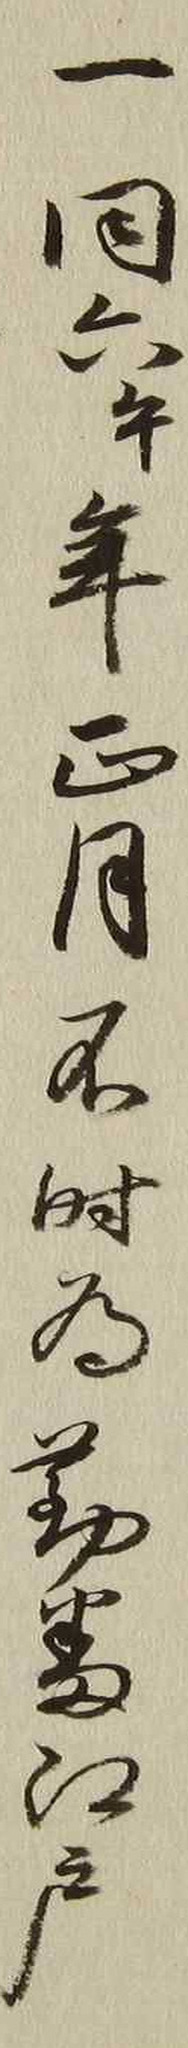一同六午年正月不時為勤番江戸
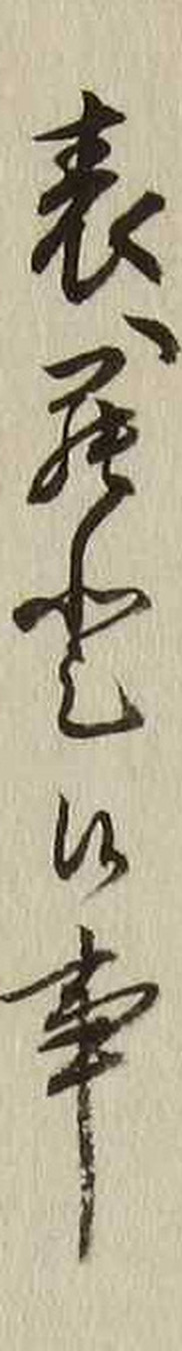表へ罷登候事
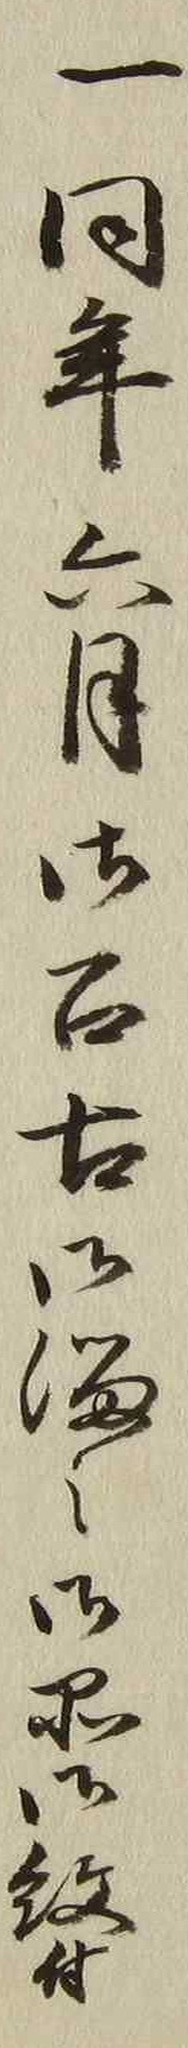一同年六月御召古御溜之御品御紋付
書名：諸士系譜　巻之61　と之部4
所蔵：会津若松市立会津図書館
